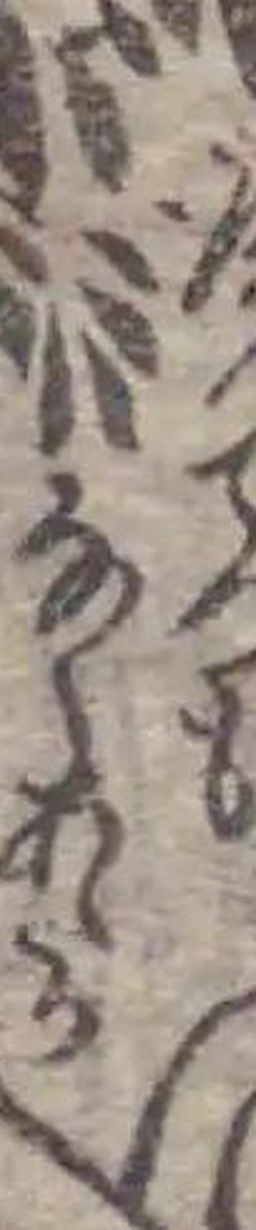なくあたか
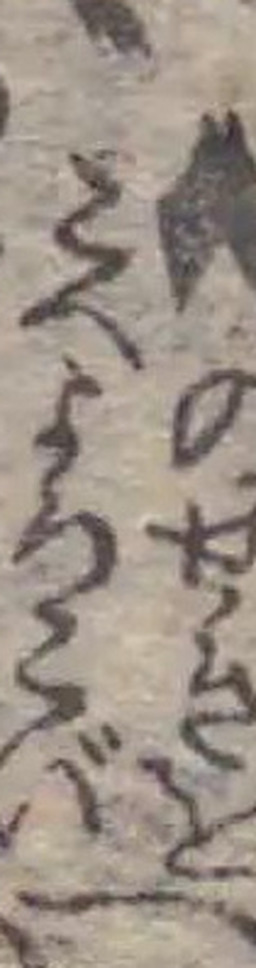こへよろこび
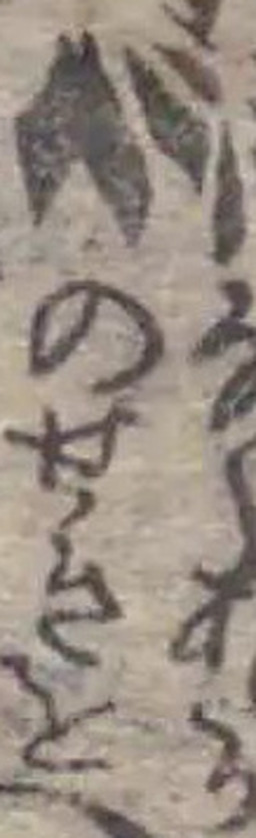のせきを
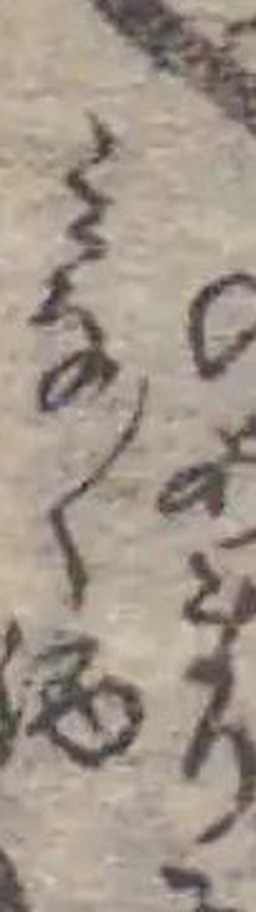みな〳〵酒
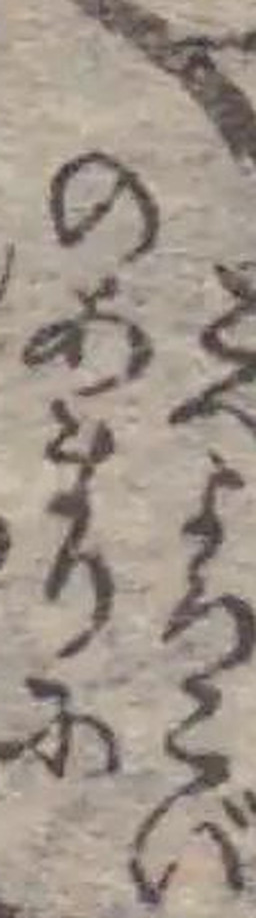のあまりに
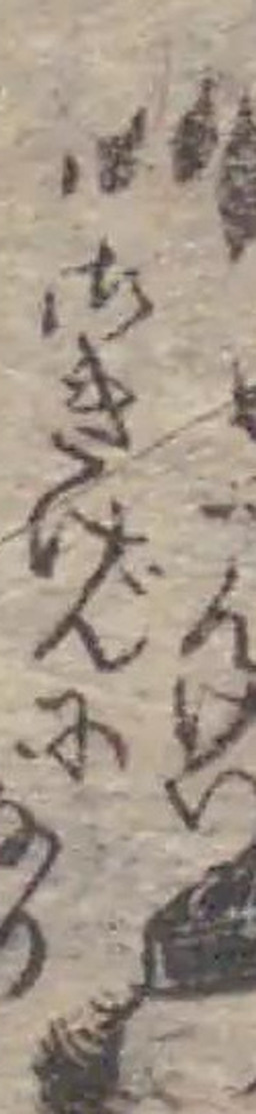御きげんになり
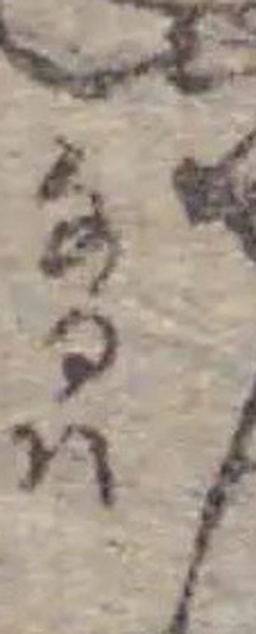なるは
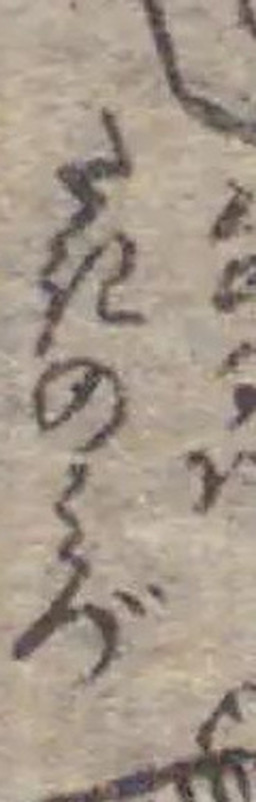たきのみづ
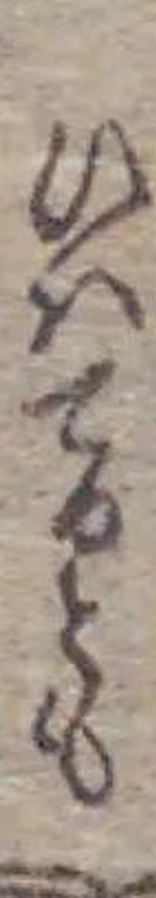ひはてるとも
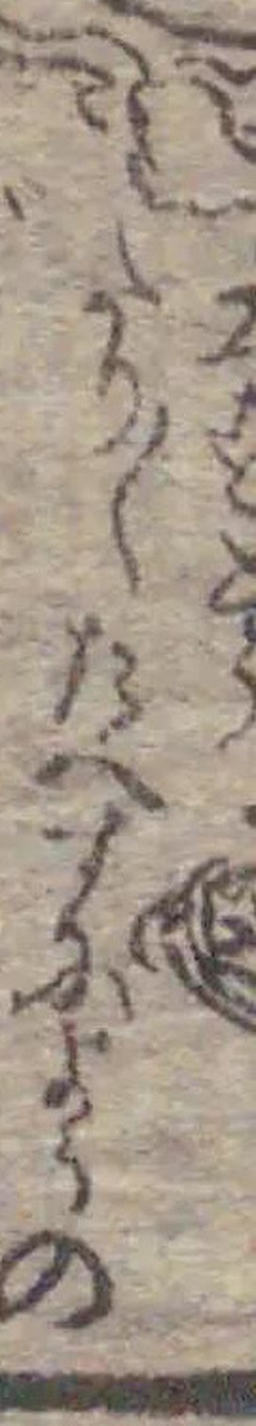たり〳〵たへすにようの
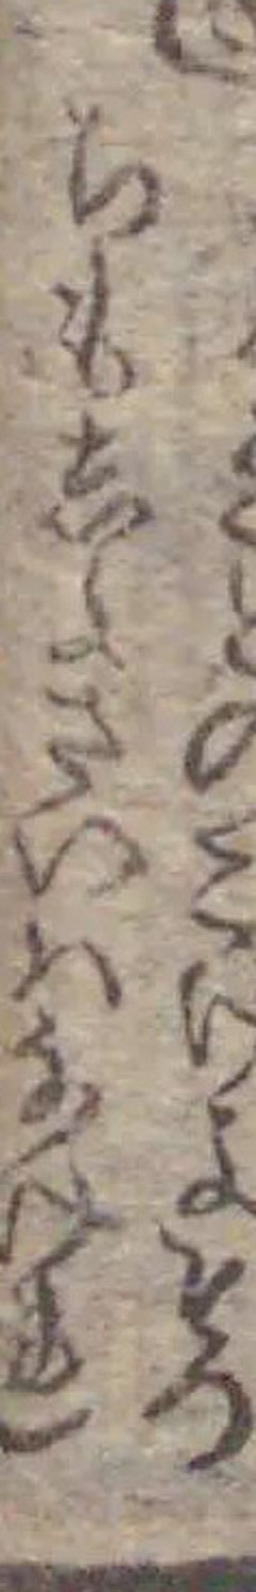ちもしよさいはなけれ
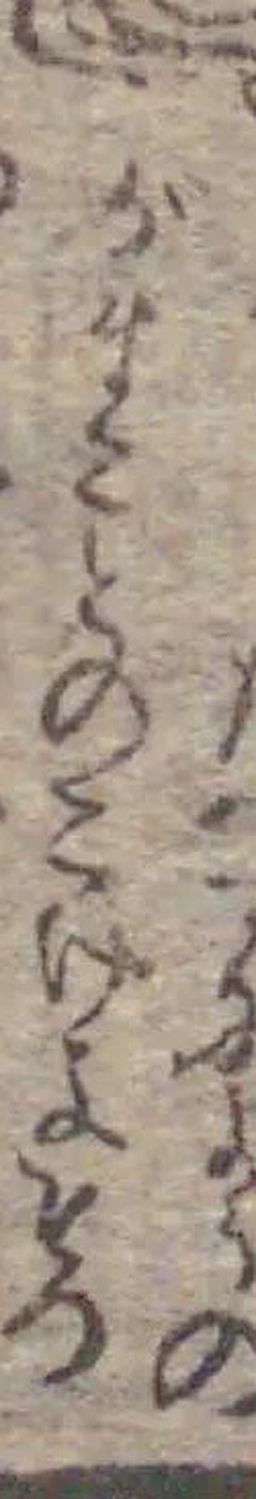がまことのこけよそつ
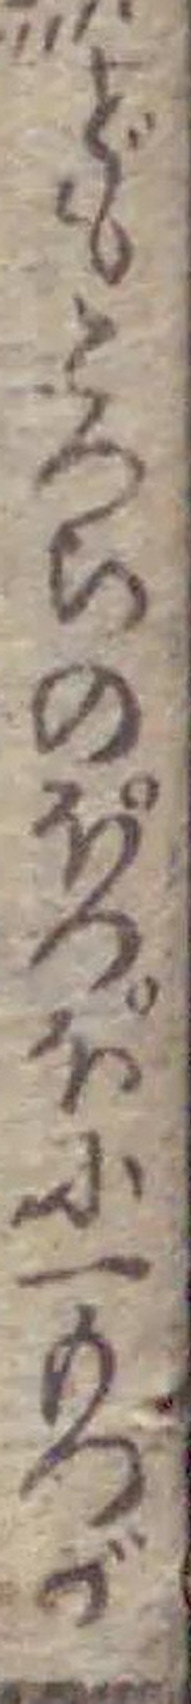どもこつちのぽつぽに一もつが
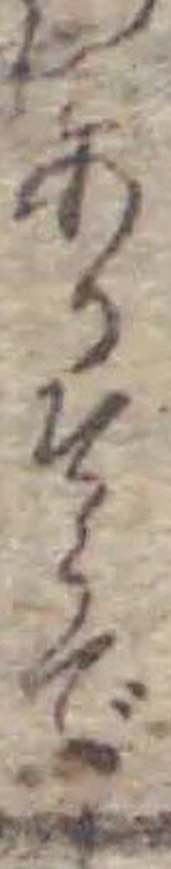あるそうで
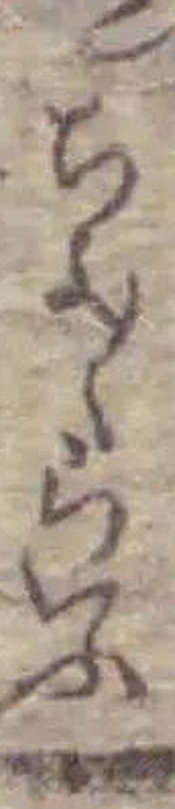ちよ〳〵らいふ
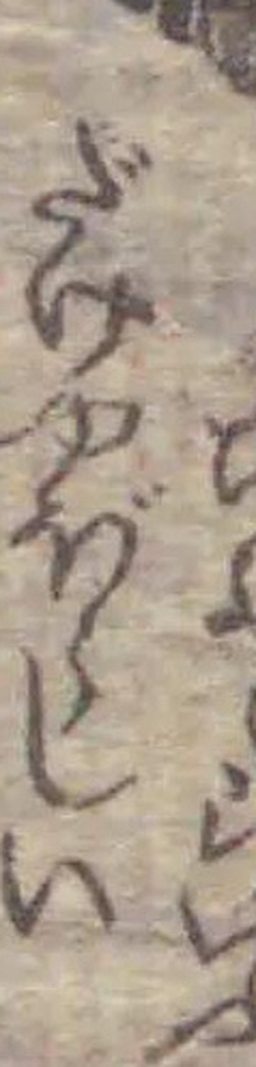だけやぼらしい
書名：通増安宅関 2巻
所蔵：国立国会図書館 National Diet Library, JAPAN
